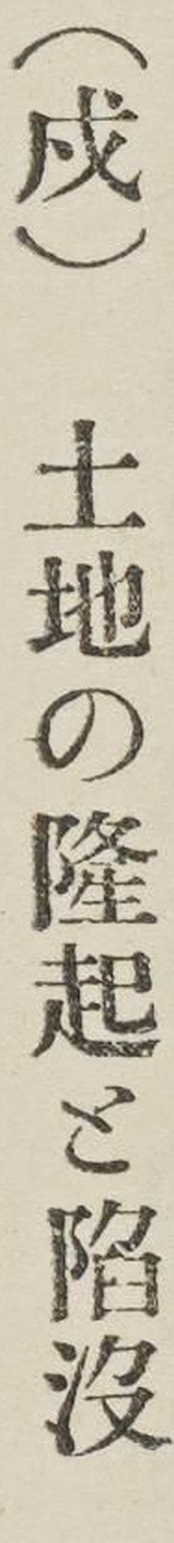土地の隆起と陥没
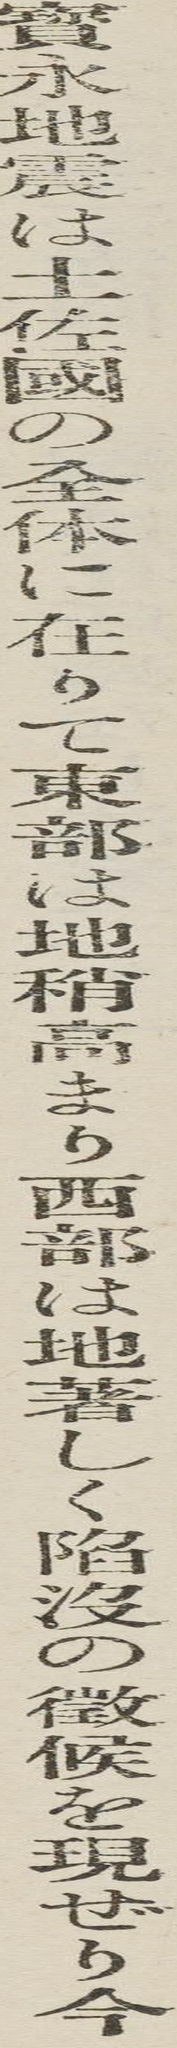宝永地震は土佐国の全体に在りて東部は地稍高まり西部は地著しく陥没の徴候を現ぜり今
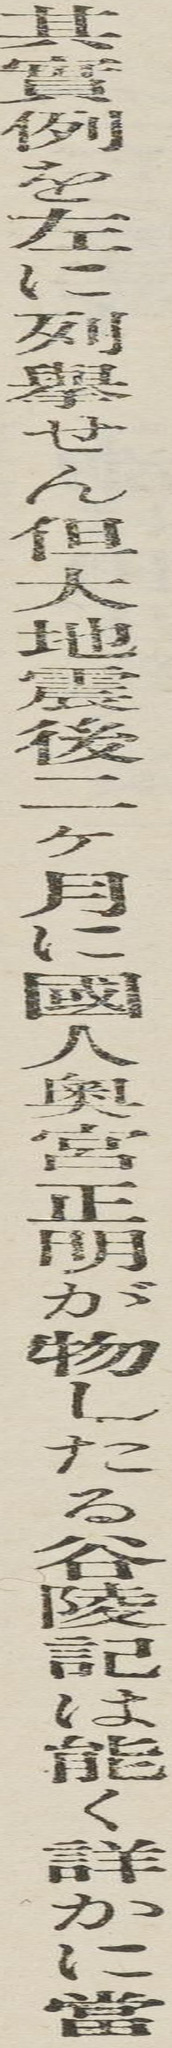其実例を左に列挙せん但大地震後二ヶ月に国人奥宮正明が物したる谷陵記は能く詳かに当
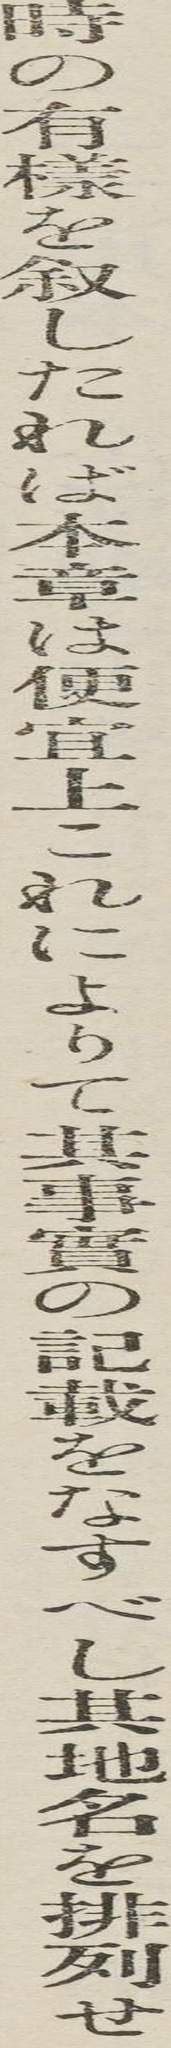時の有様を叙したれば本章は便宜上これによりて其事実の記載をなすべし其地名を排列せ
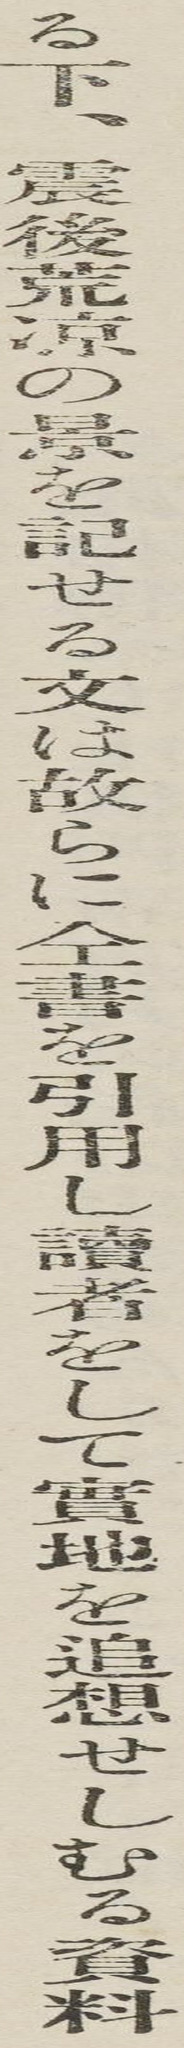る下、震後荒涼の景を記せる文は故らに同書を引用し読者をして実地を追想せしむる資料
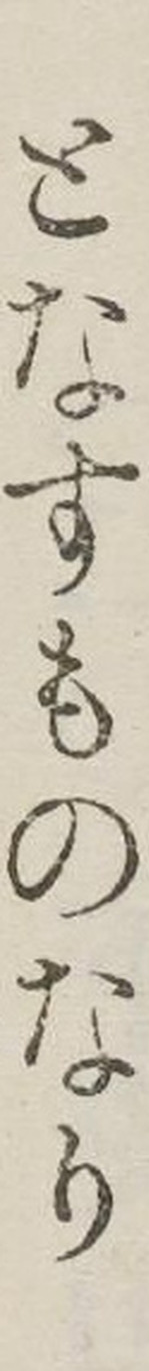となすものなり
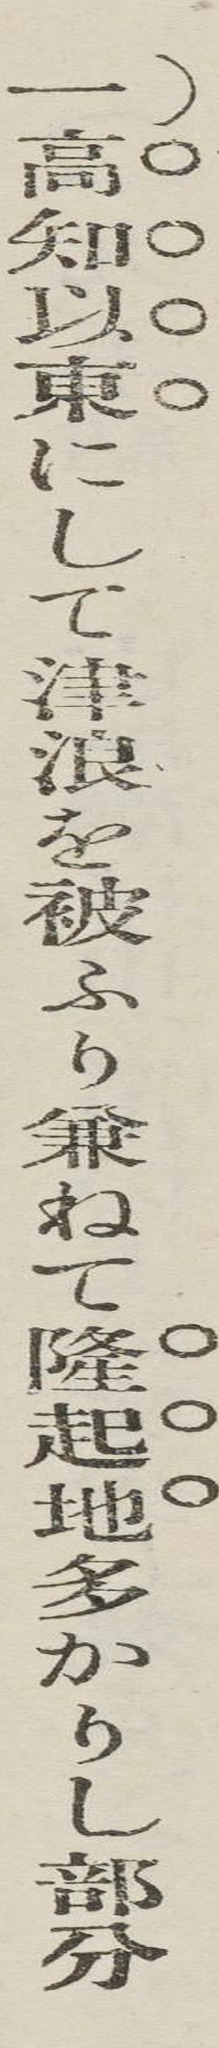㈠高知以東にして津浪を被ふり兼ねて隆起地多かりし部分
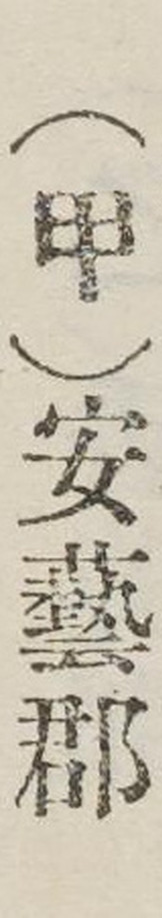安芸郡
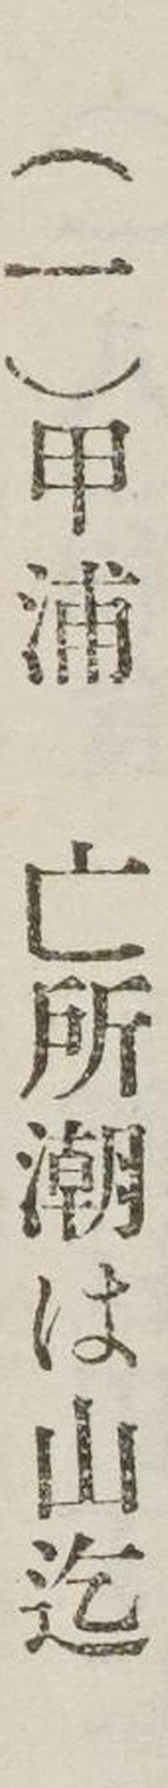甲浦亡所潮は山迄
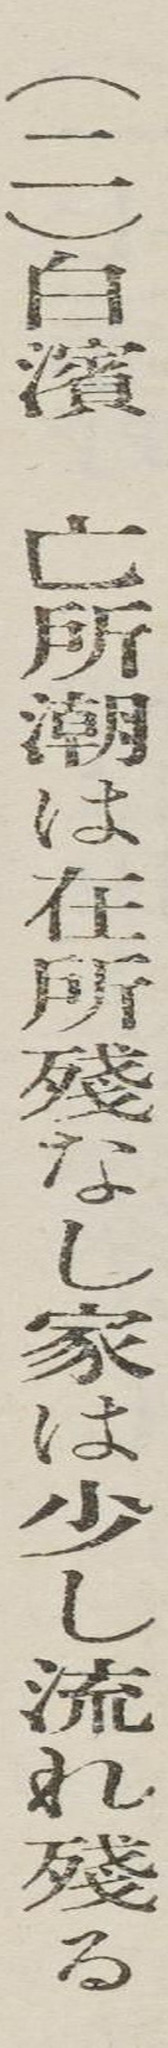白浜亡所潮は在所残なし家は少し流れ残る
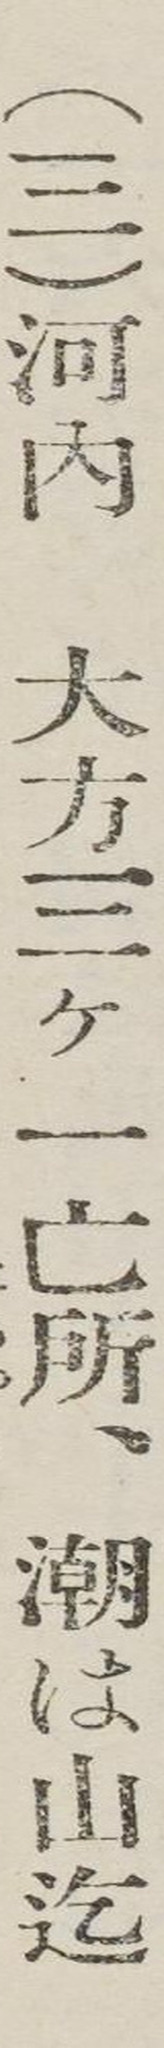河内大方三ヶ一亡所、潮は山迄
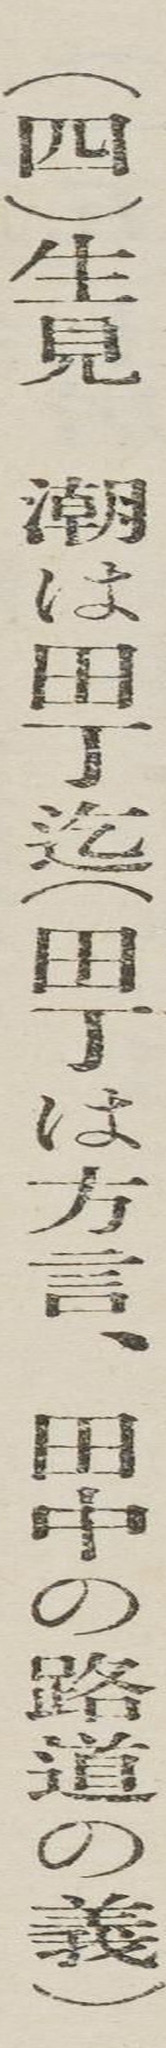生見潮は田丁迄は方言、田中の路道の義）
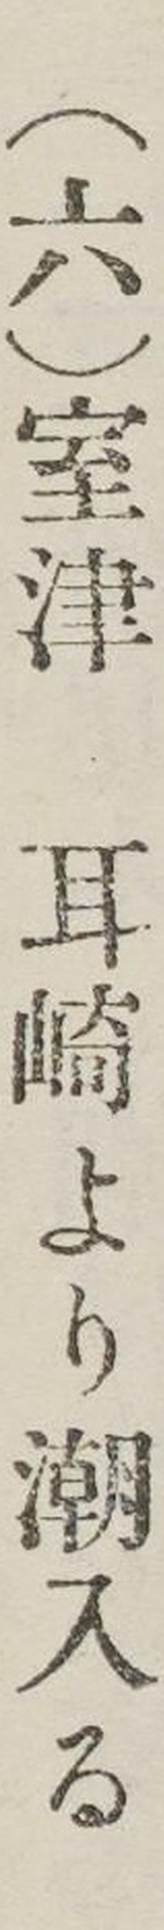室津耳崎より潮入る
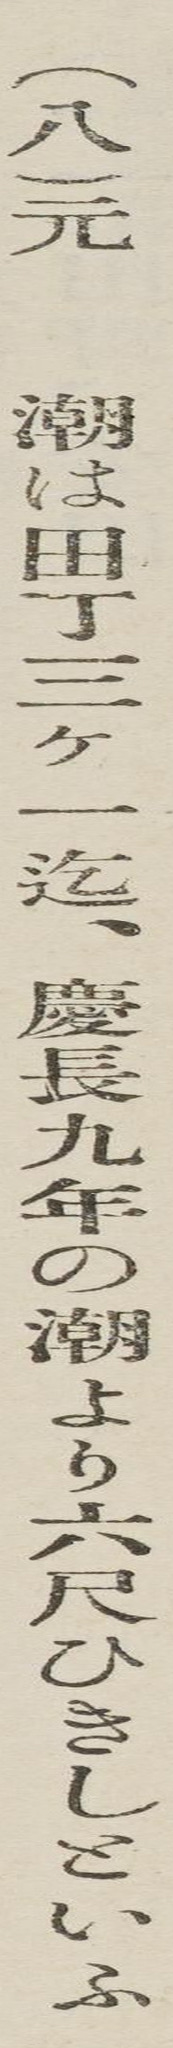元潮は田丁三ヶ一迄、慶長九年の潮より六尺ひきしといふ
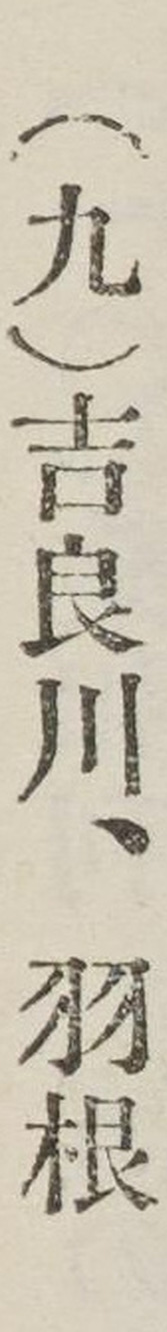吉良川、羽根

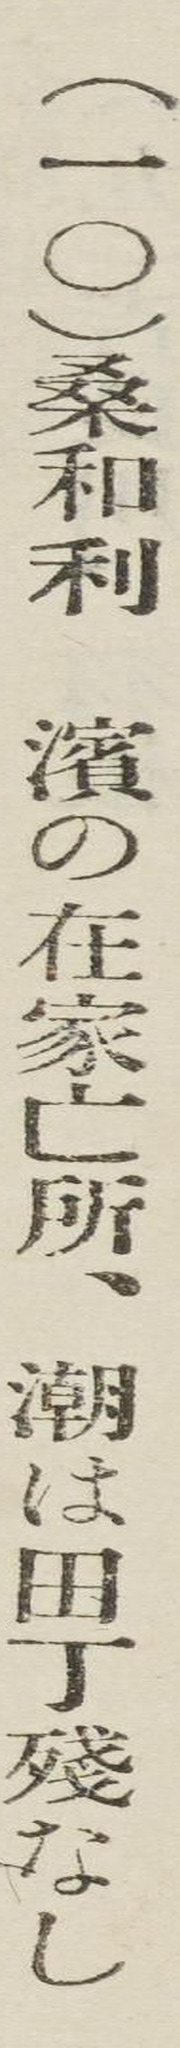桑和利濱の在家亡所、潮は田丁残なし
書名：土佐古今ノ地震
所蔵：東京大学地震研究所図書室 Earthquake Research Institute Library, The University of Tokyo, JAPAN
